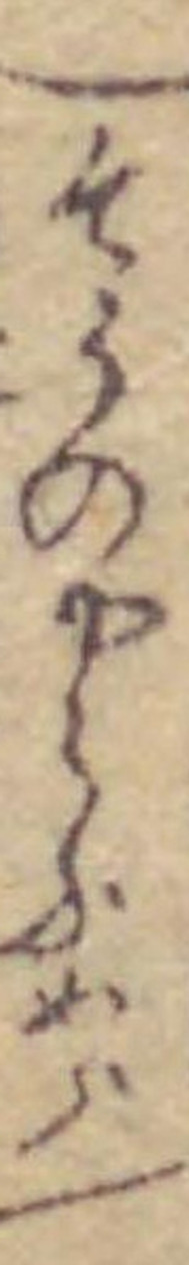そうのやうふめら
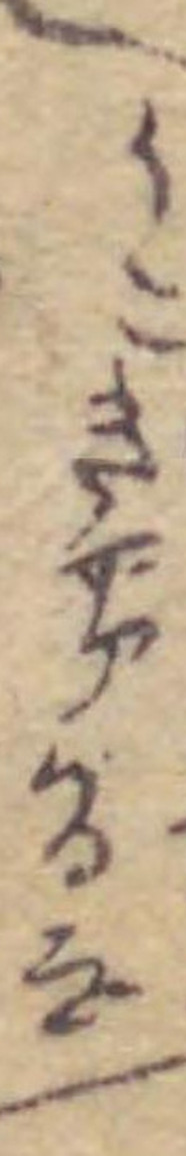うこきやァかるぞ
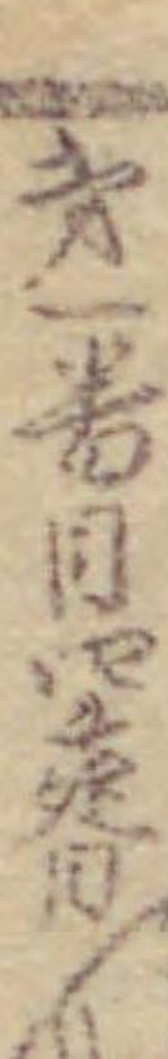第一番目四建目
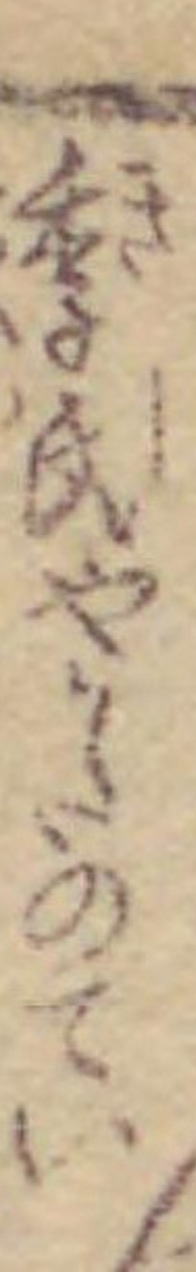李氏やかたのてい
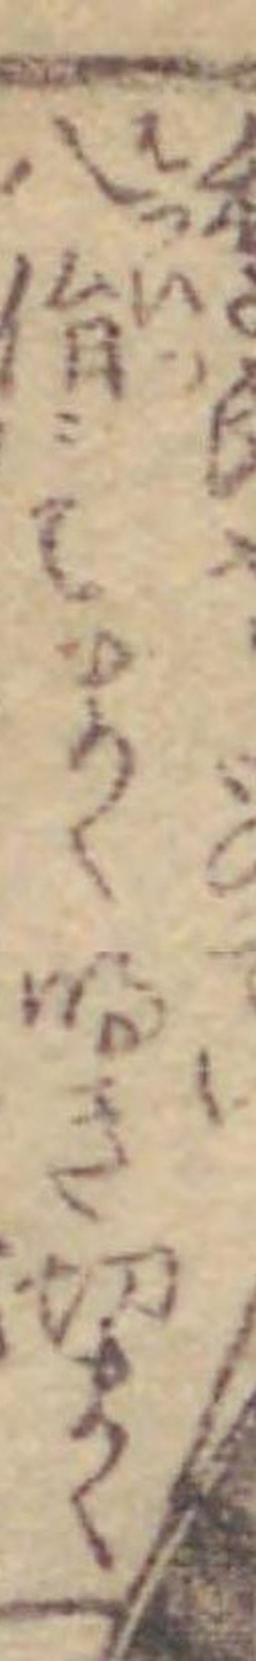八佾にてまく明き切まく
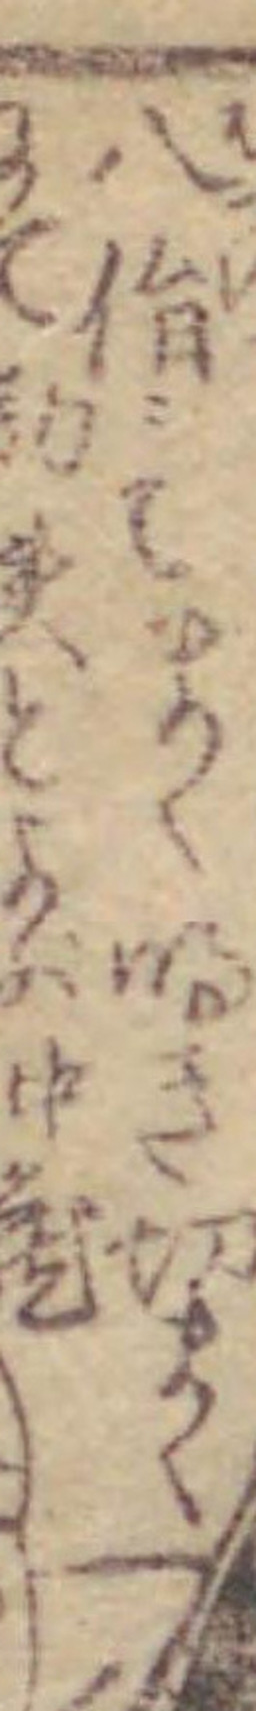にて勅使とよぶ仲蔵
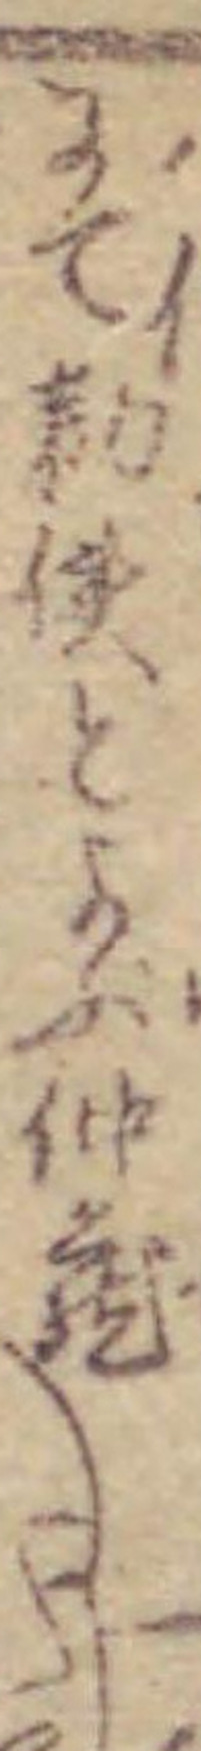にて勅使とよぶ仲蔵
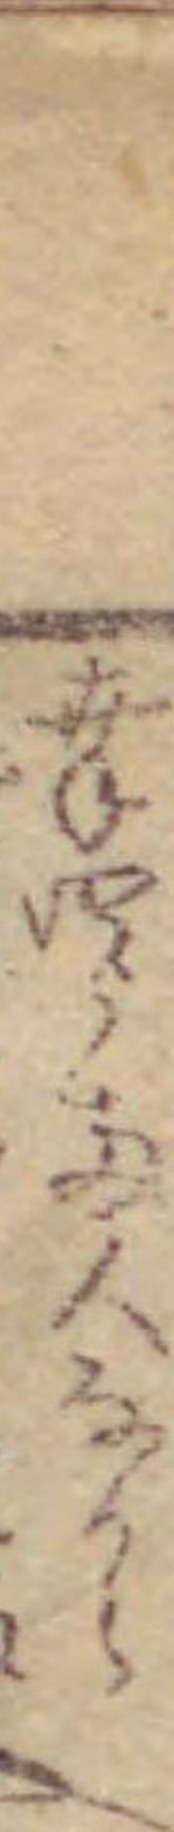幸四郎両人なから
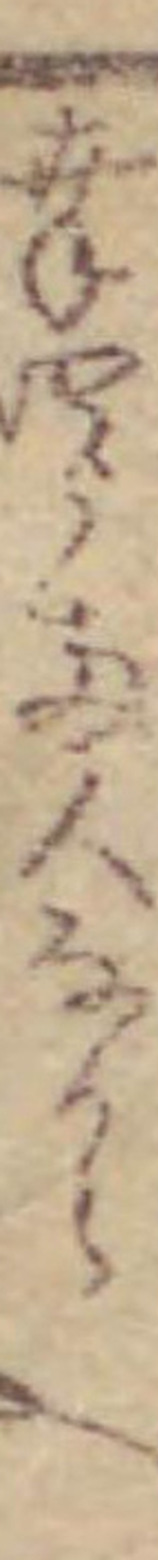幸四郎両人なから
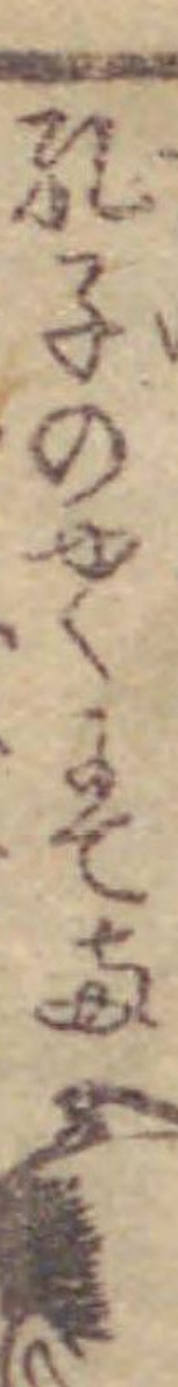孔子のやくにて両
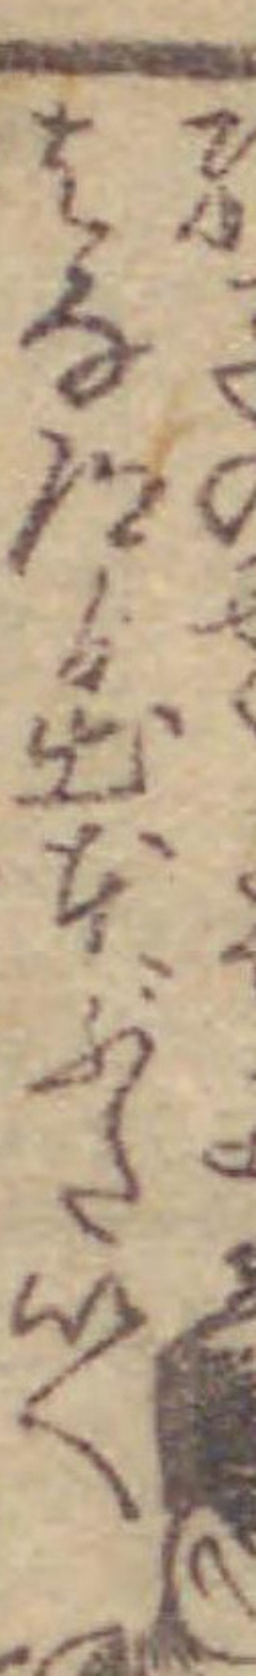はな道ゟ出本ぶたいへ
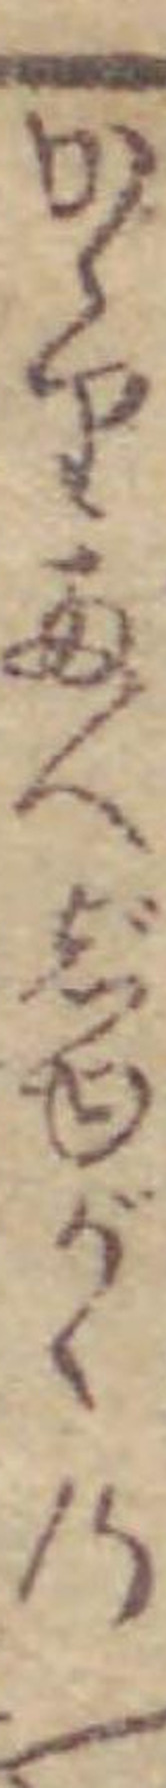かゝり両人じゆがくの
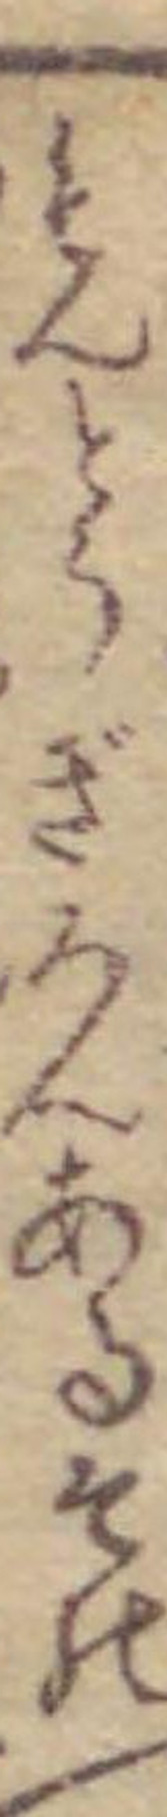もんとうぎろんあるその
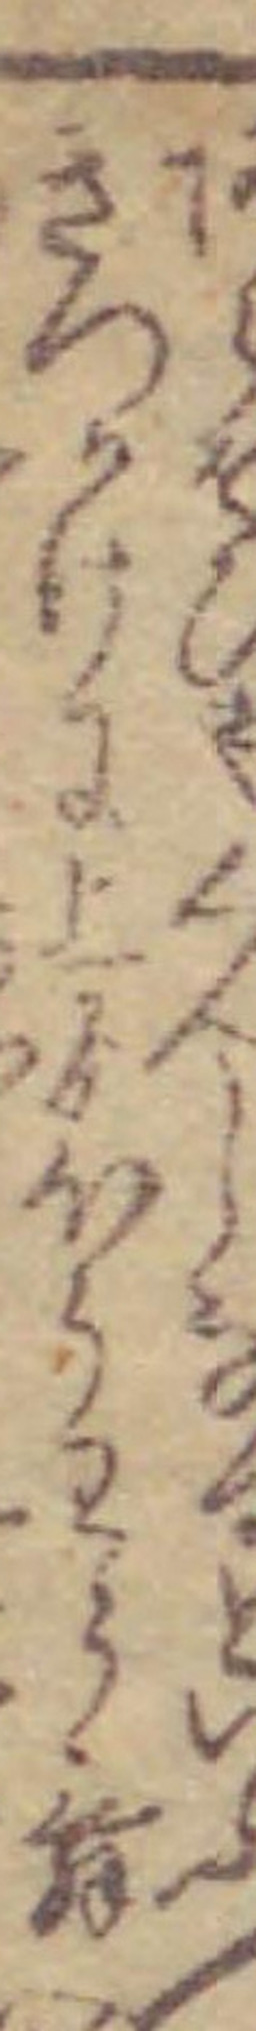きつかけに上ゟほうわう三羽
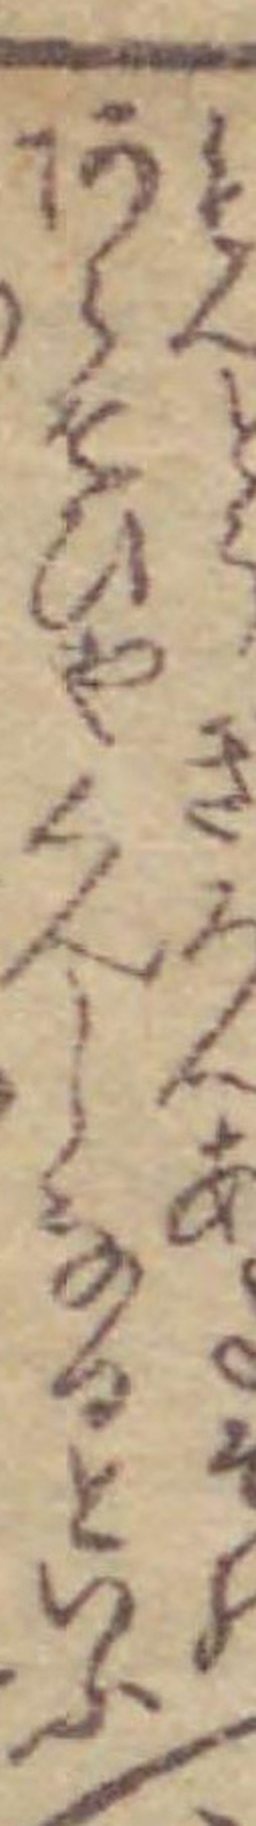あらそひやくんしなるといふ
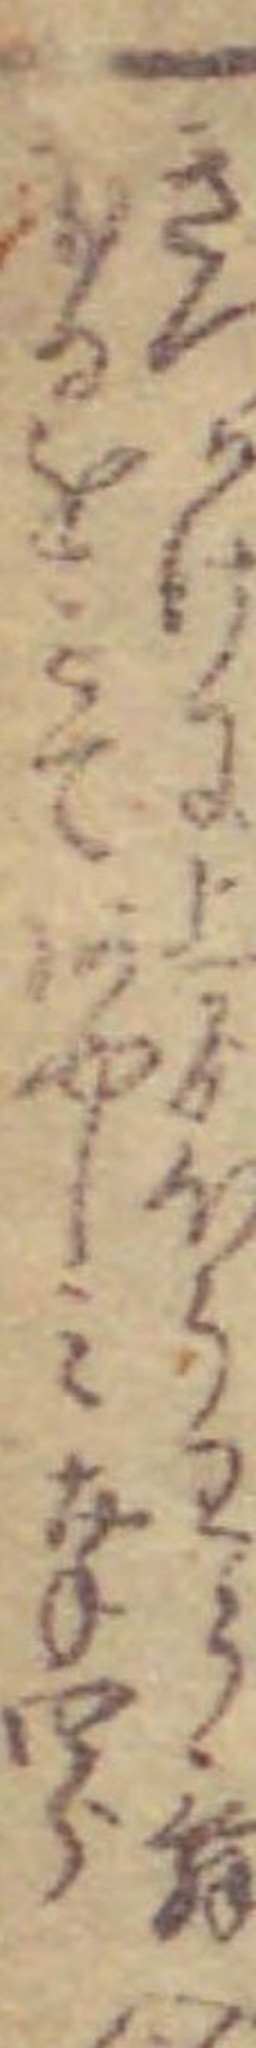下るをみてあやしみ幸四郎
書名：天下一面鏡梅鉢 : 3巻
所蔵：国立国会図書館 National Diet Library, JAPAN
